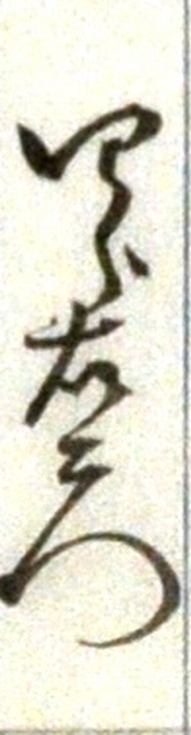四郎右衛門
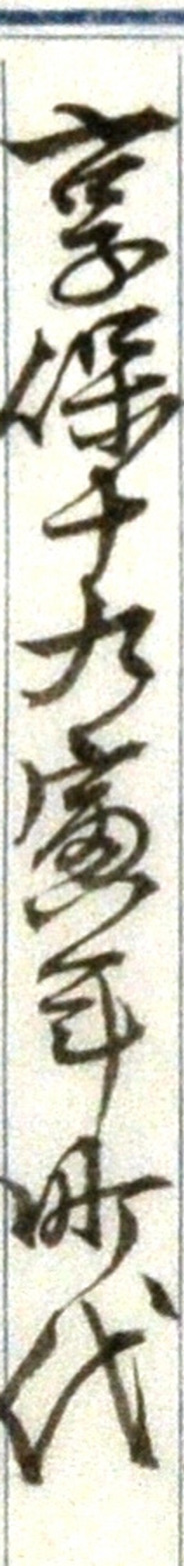享保十九寅年町代
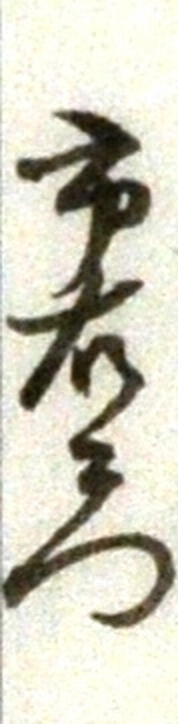長右衛門
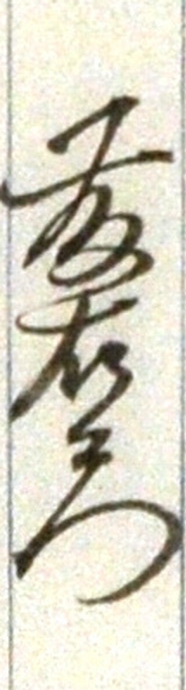長右衛門
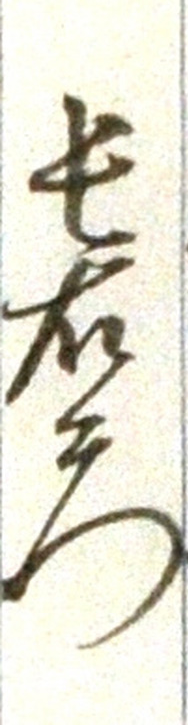長右衛門
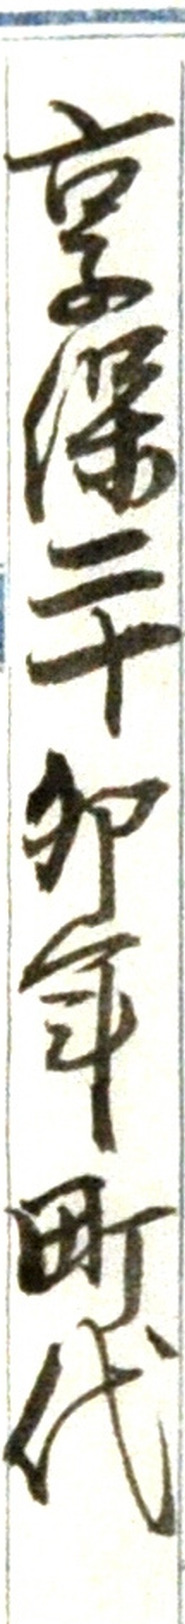享保二十卯年町代

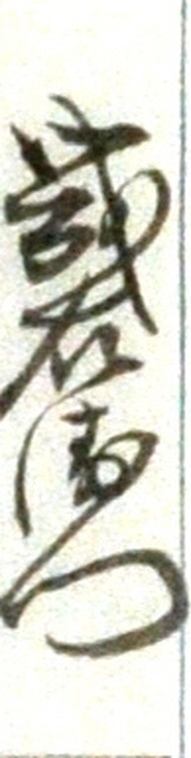忠右衛門
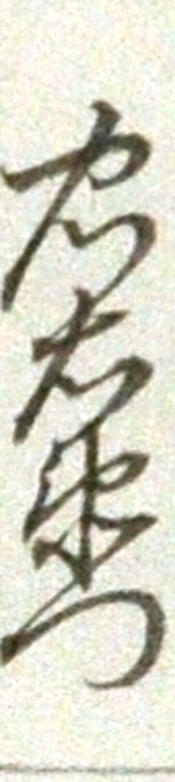忠右衛門
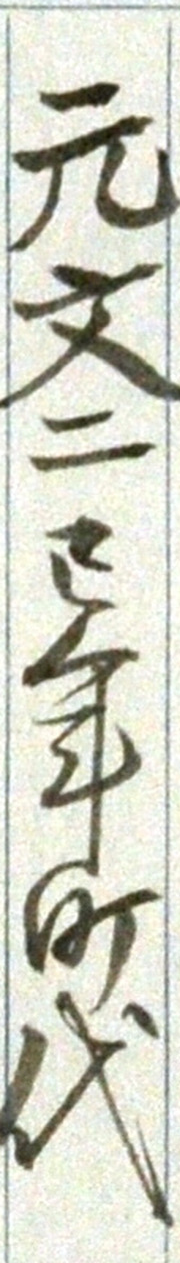元文二巳年町代
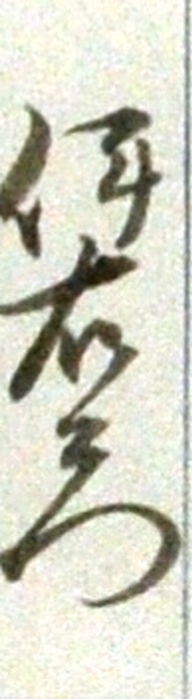忠右衛門
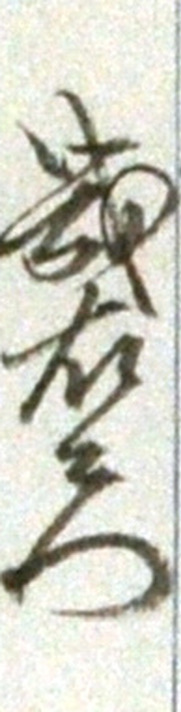忠右衛門
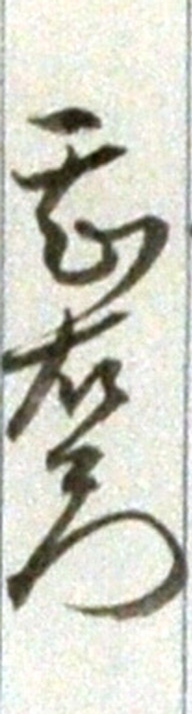忠右衛門
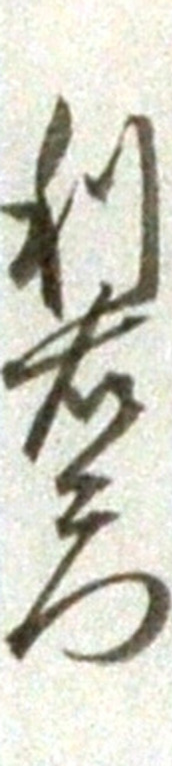忠右衛門
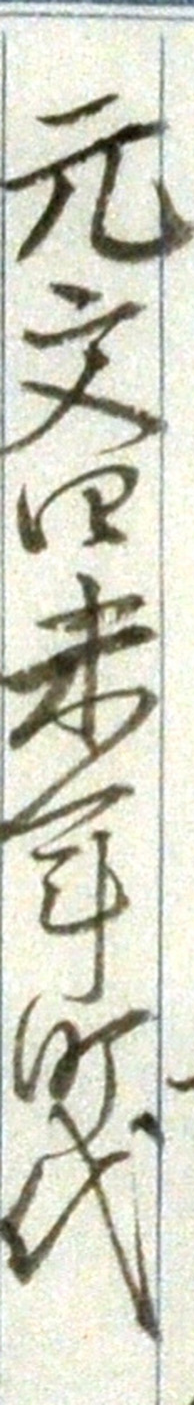元文四未年町代
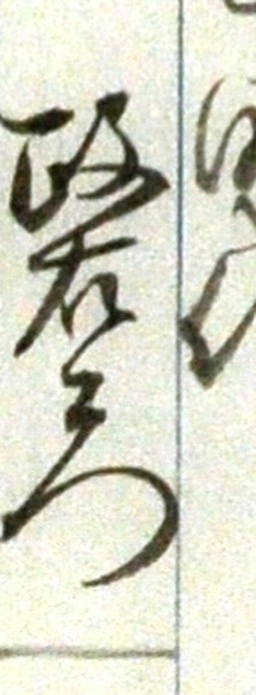忠右衛門
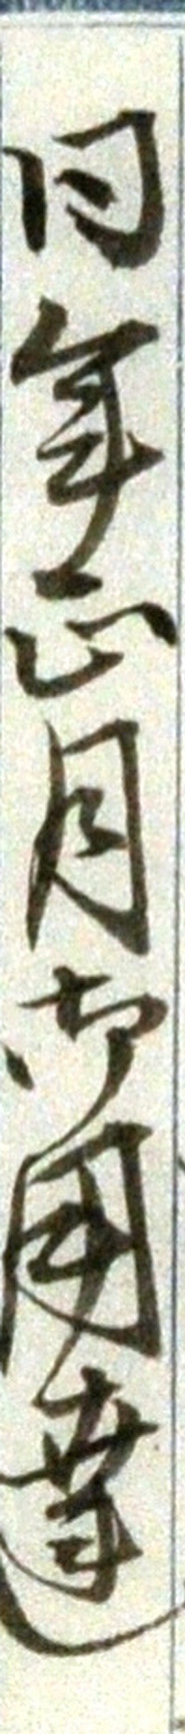同年正月御用達
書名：町方町代名前書
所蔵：伊那市立高遠町図書館・合同会社AMANE
